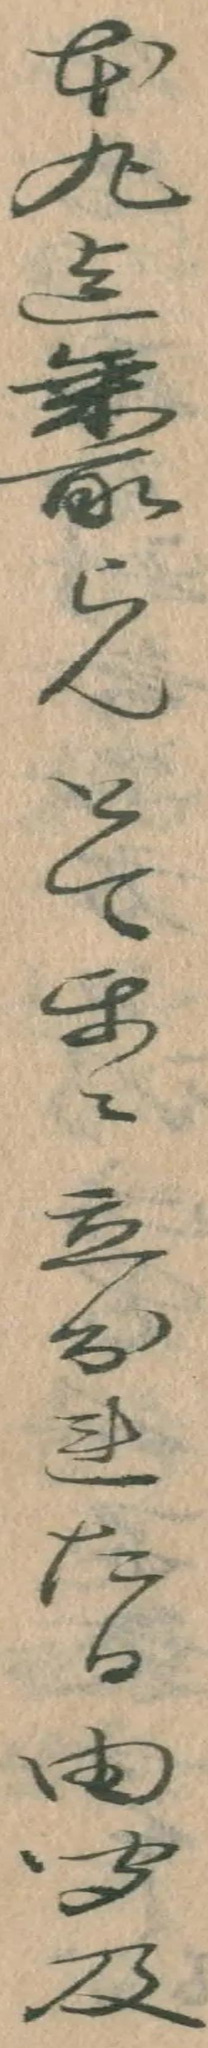本丸迄乗取らんとて互に立分連たる由聞及
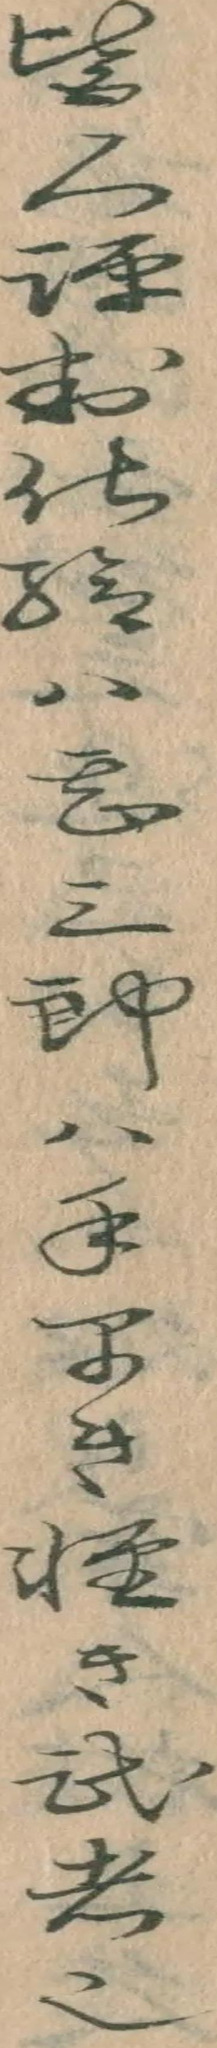皆人評判仕給は甚三郎は手早き軽き武者也
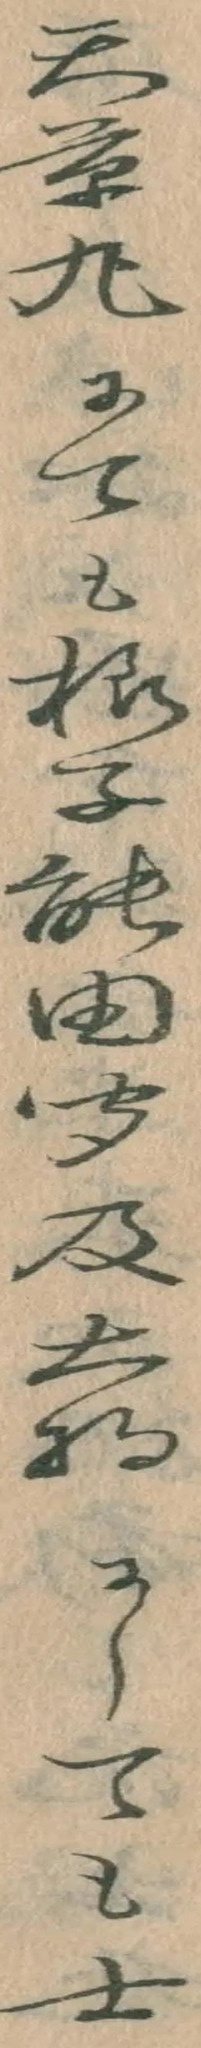天草丸尓ても様子能由聞及大将尓しても士
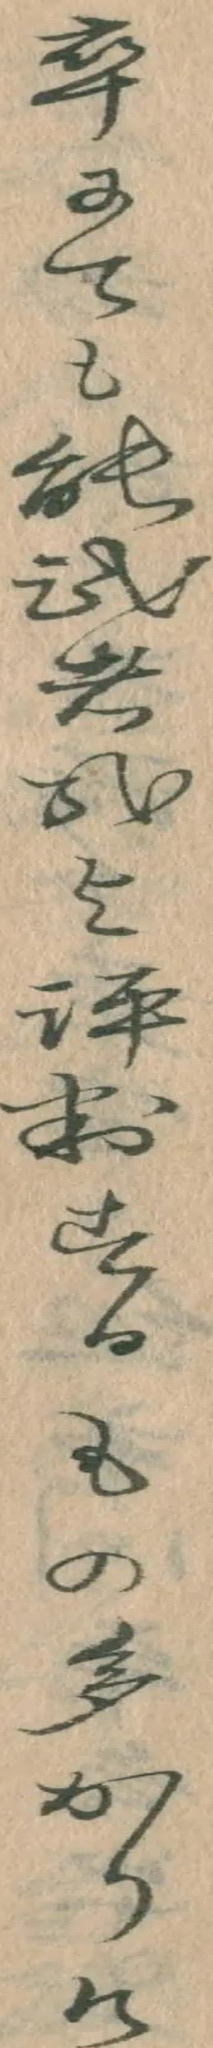卒尓ても能武者哉与評判春るもの多かりけ
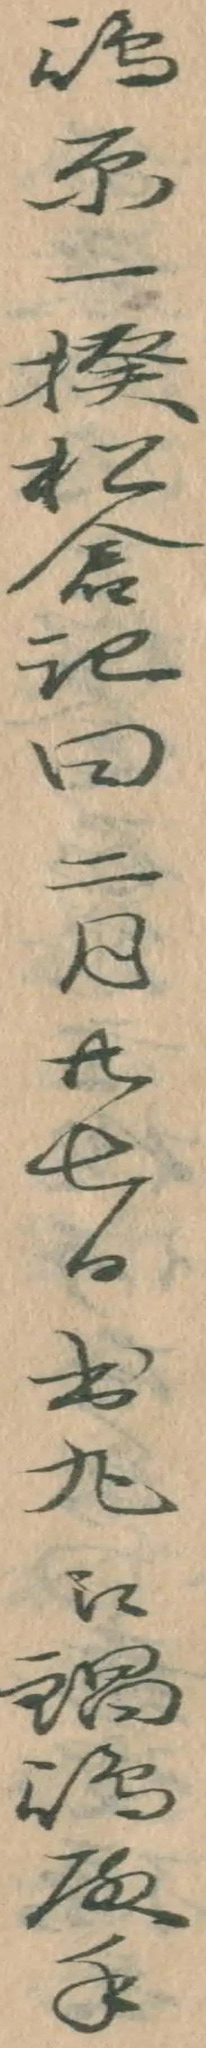島原一揆松倉記曰二月廿七日出丸江鍋島殿手

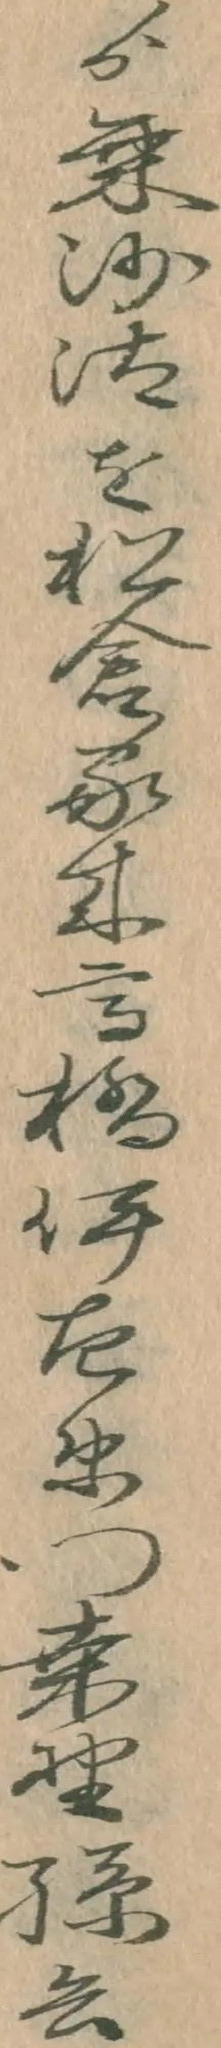ゟ乗沙汰を松倉家来高橋伊左衛門桑野孫兵
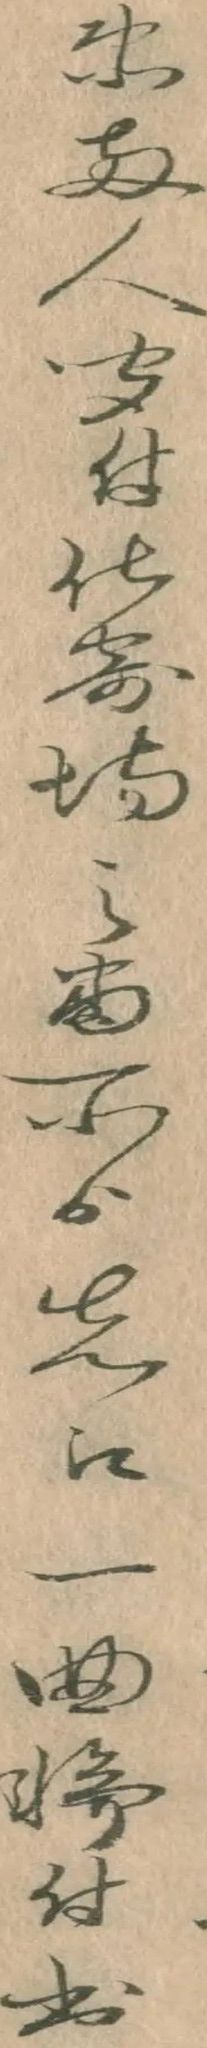衛両人聞付仕寄場之番所ゟ先江一曲輪付出
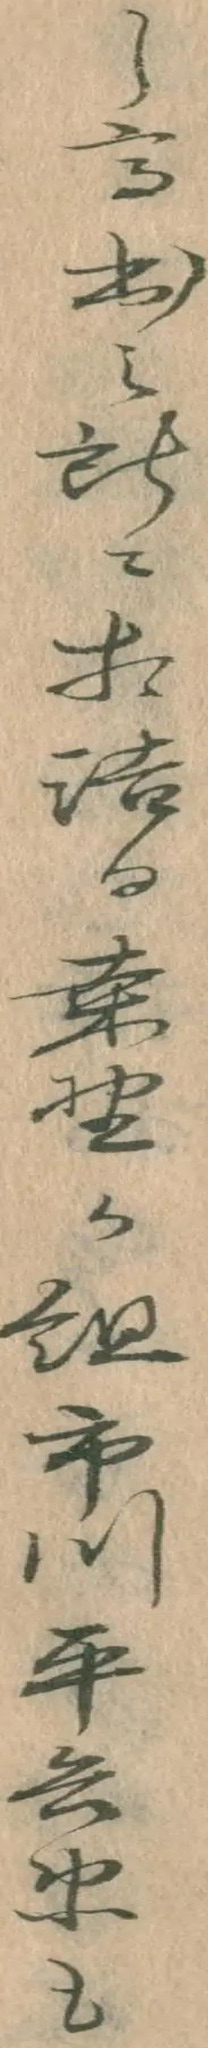し高出の所に相詰る桑野か組市川平兵衛も
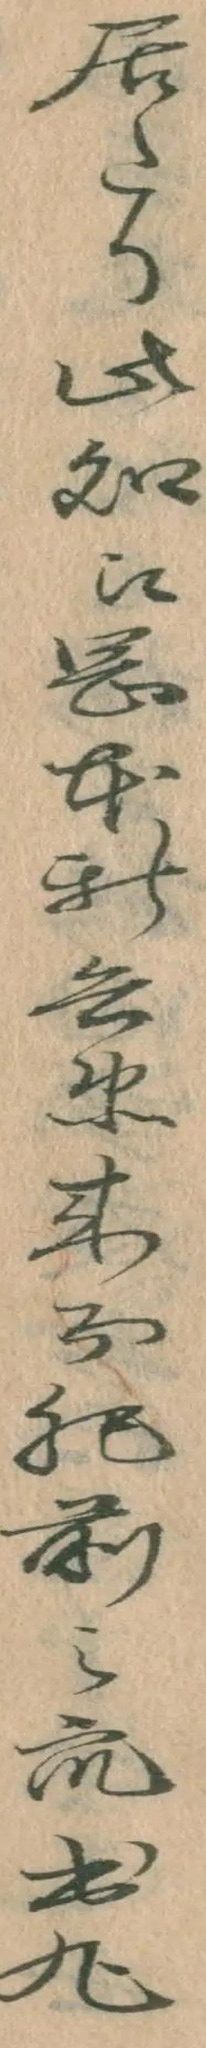居たり此処江岡本新兵衛来而肥前之衆出丸
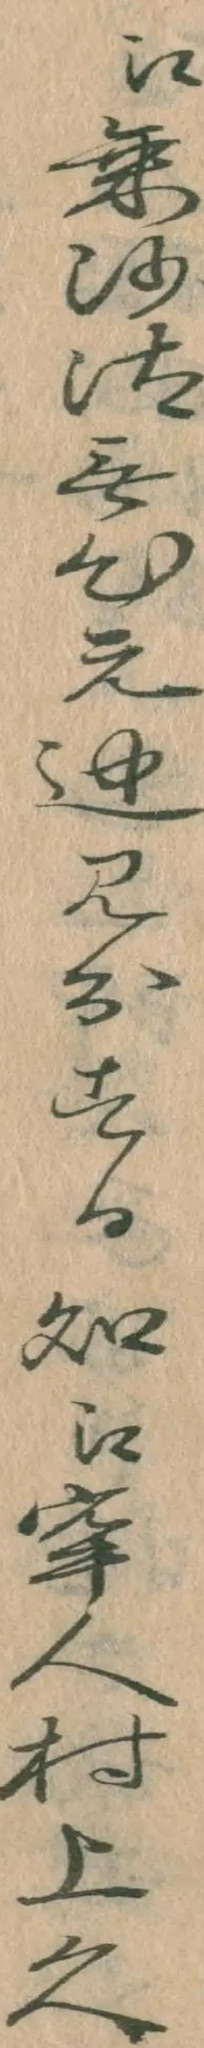江乗沙汰無心元迚見分春る処江牢人村上久
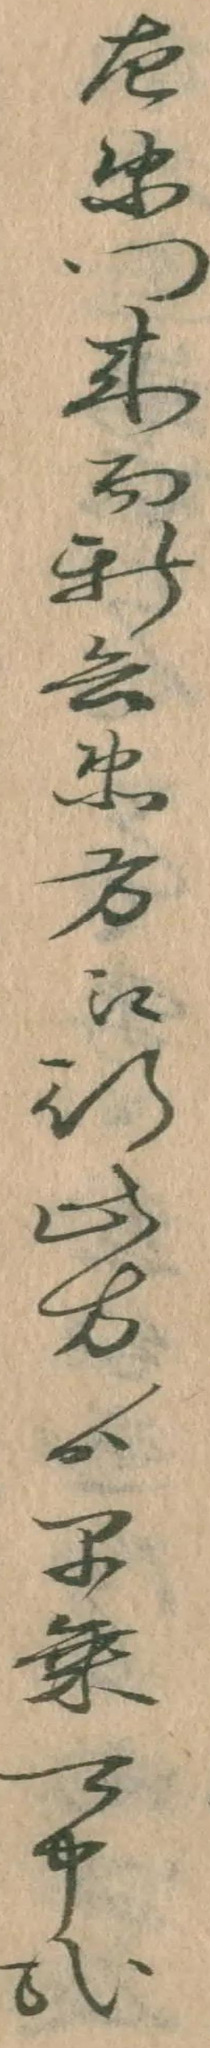左衛門来而新兵衛方江行此方ゟ早乗可申哉
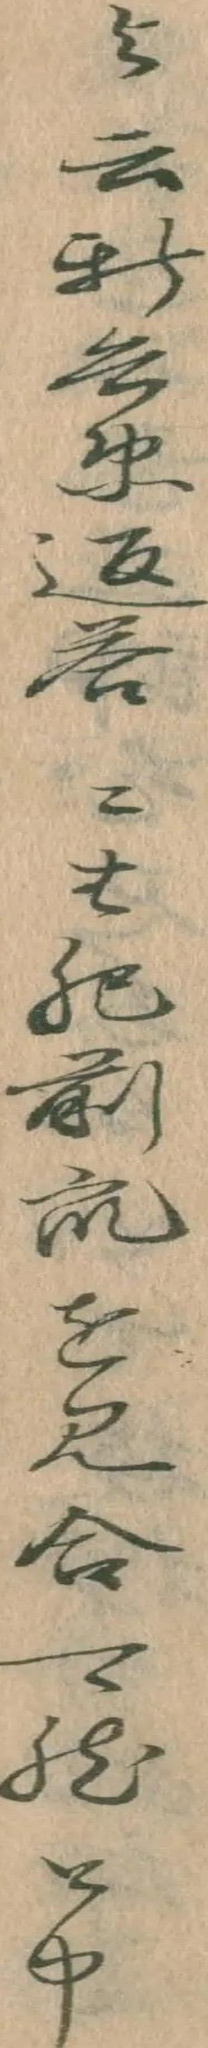与云新兵衛返答に者肥前衆を見合可然と申
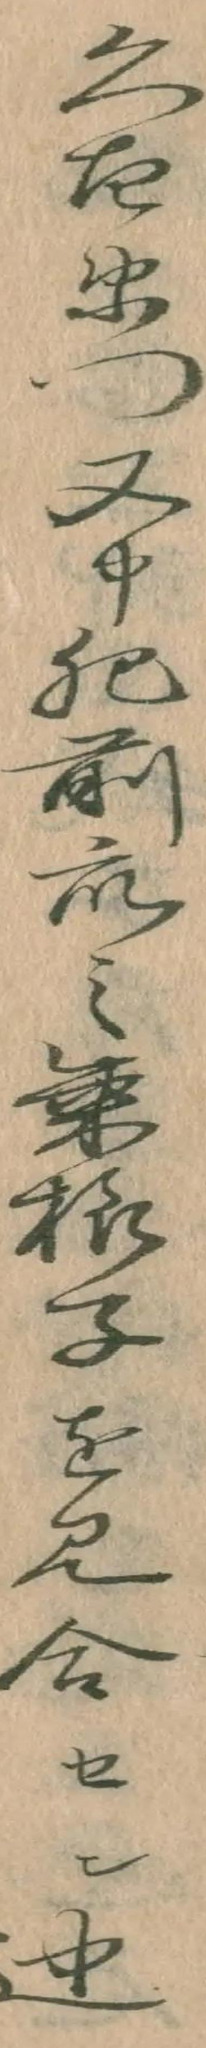久左衛門又申肥前衆之乗様子を見合せん迚
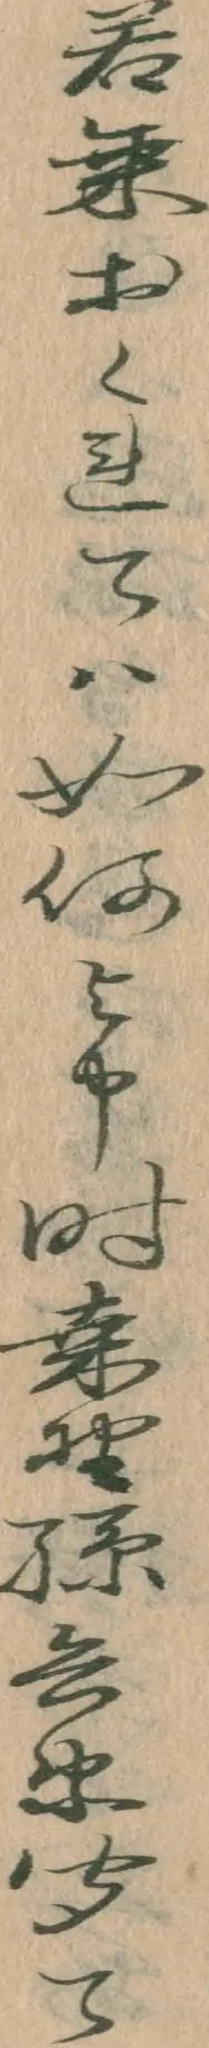若乗おく連ては如何与申時桑野孫兵衛聞て
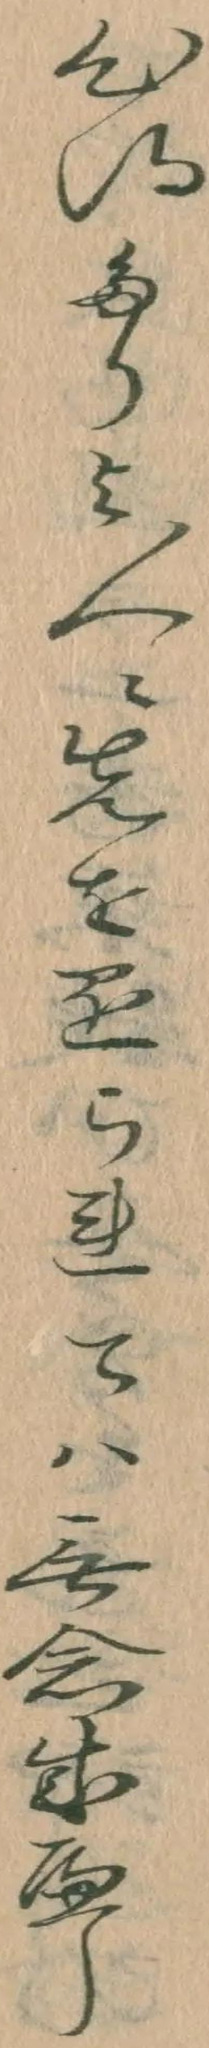心得多り与人に先を懸ら連ては無念成扁し
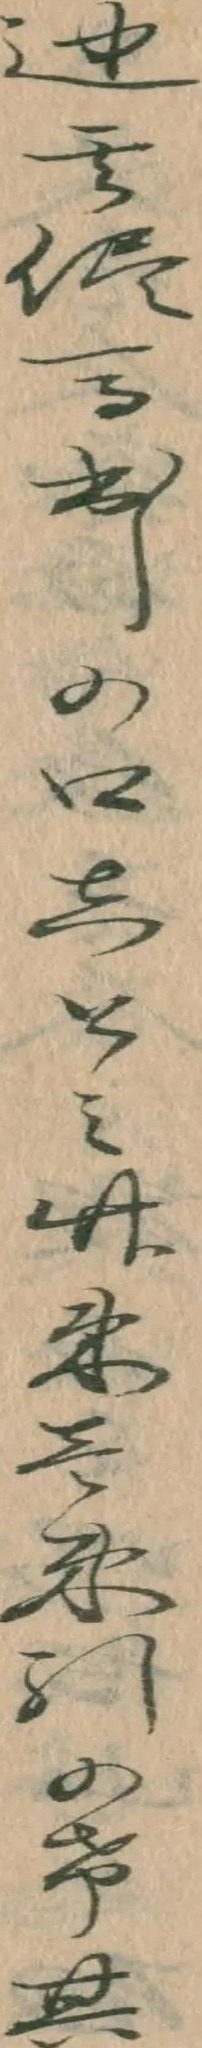迚其侭馬出しの口志とみ竹束壱束引の希其
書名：切支丹御退治記 49巻. [8]
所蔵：国立国会図書館 National Diet Library, JAPAN
